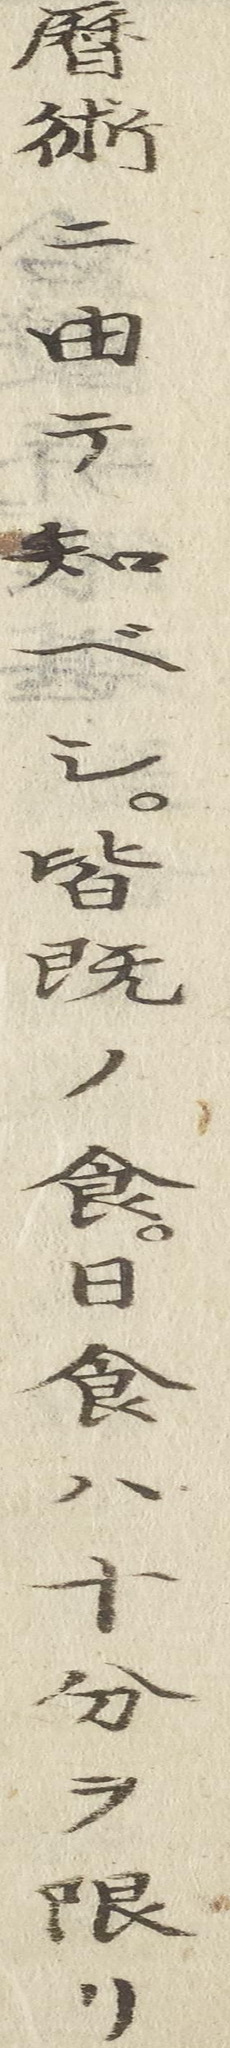暦術ニ由テ知ベシ。皆既ノ食。日食ハ十分ヲ限リ
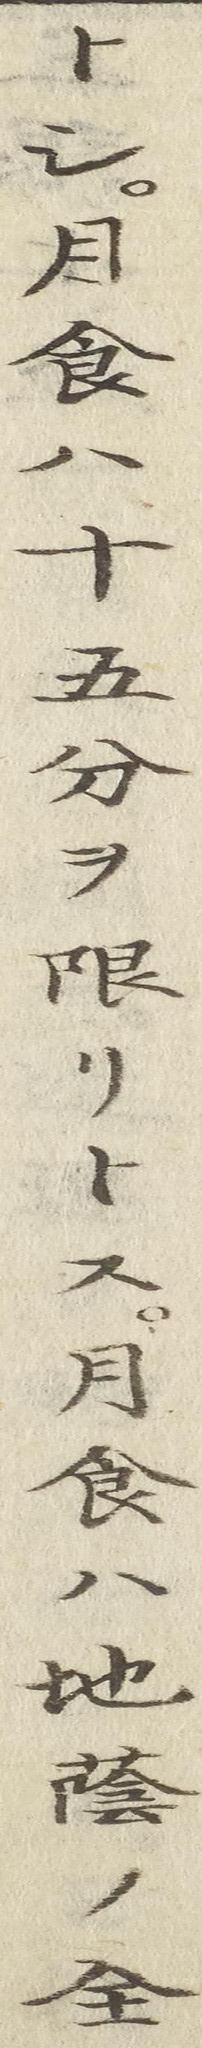トシ。月食ハ十五分ヲ限リトス。月食ハ地蔭ノ全
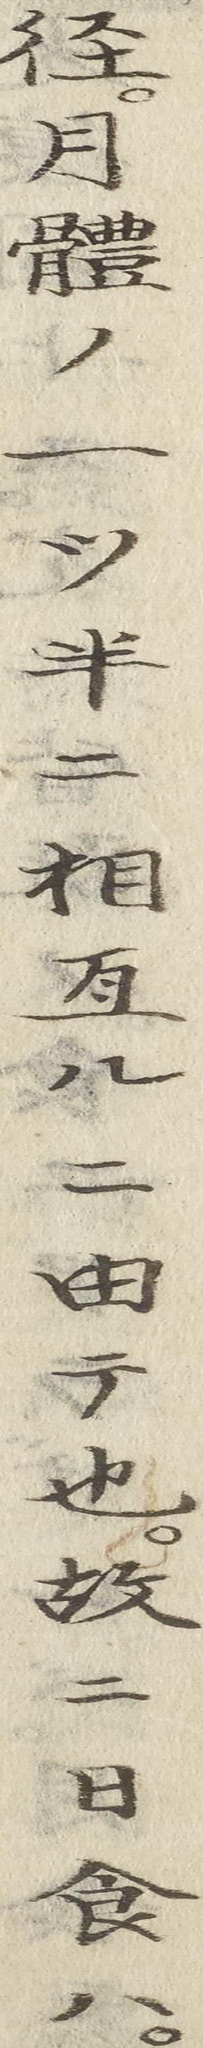径。月体ノ一ツ半ニ相亙ル由テ也。故ニ日食ハ。
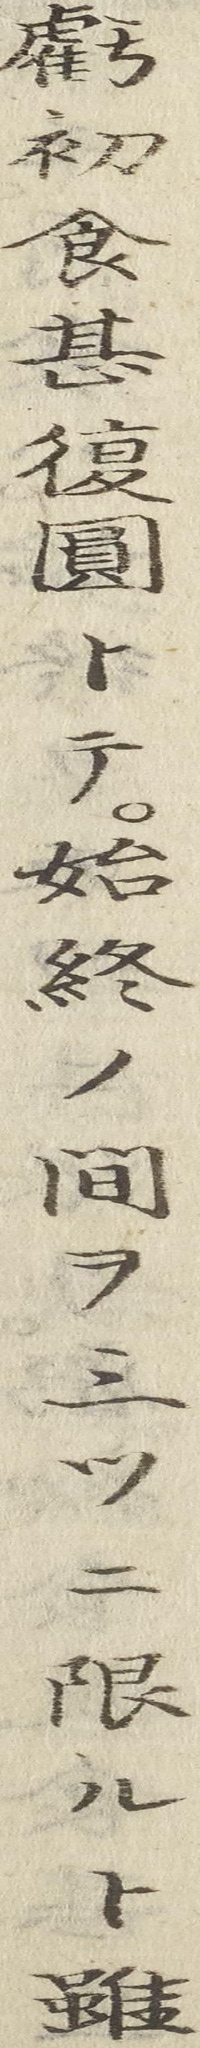虧初食甚復円トテ。始終ノ間ヲ三ツニ限ルト雖

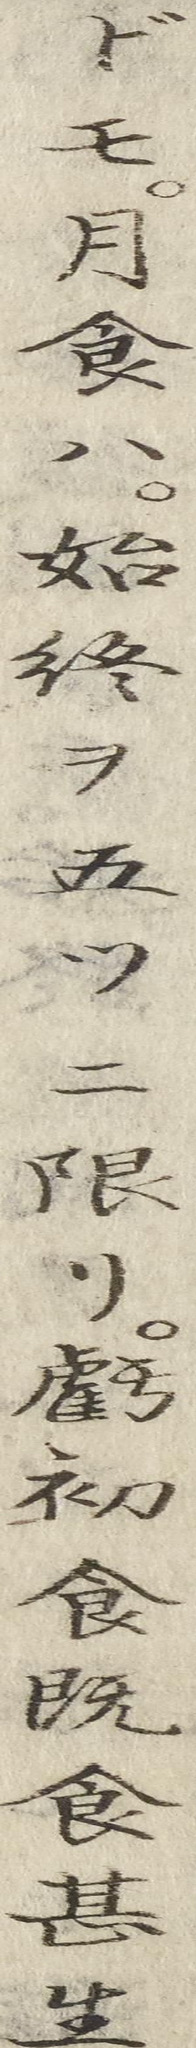ドモ。月食ハ。始終ヲ五ッニ限リ。虧初食既食甚生
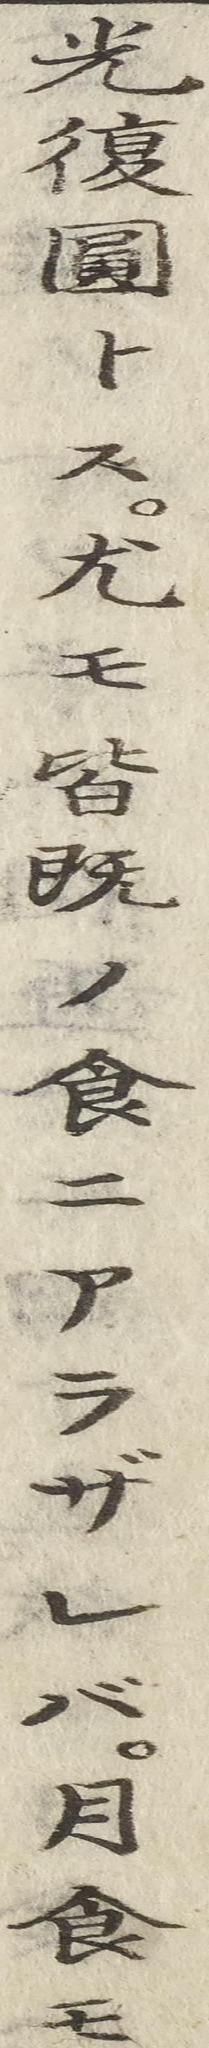光復円トス。尤モ皆既ノ食ニアラザレバ。月食モ
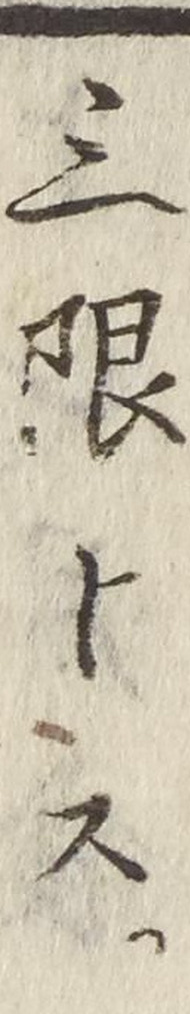三限トス。
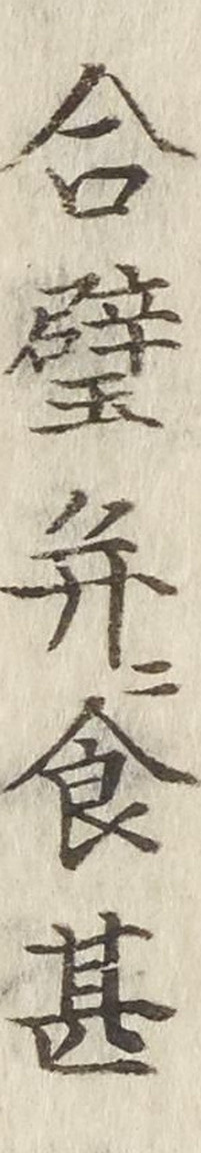合璧幷ニ食甚
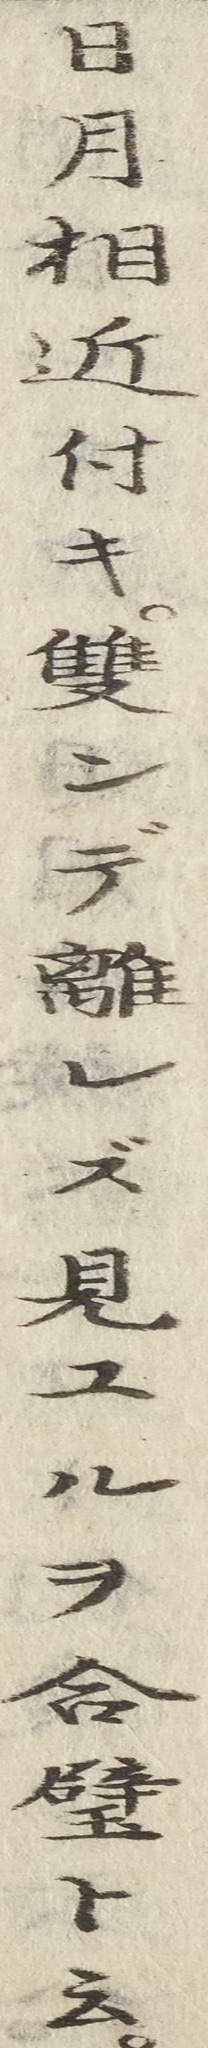日月相近付キ。雙ンデ離レズ見ユルヲ合璧ト云。
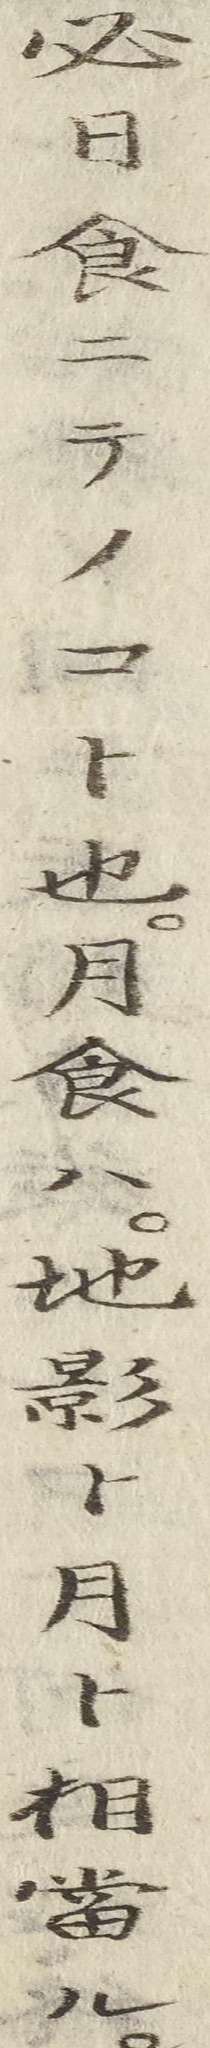必日食ニテノコト也。月食ハ。地影ト月ト相当ル。
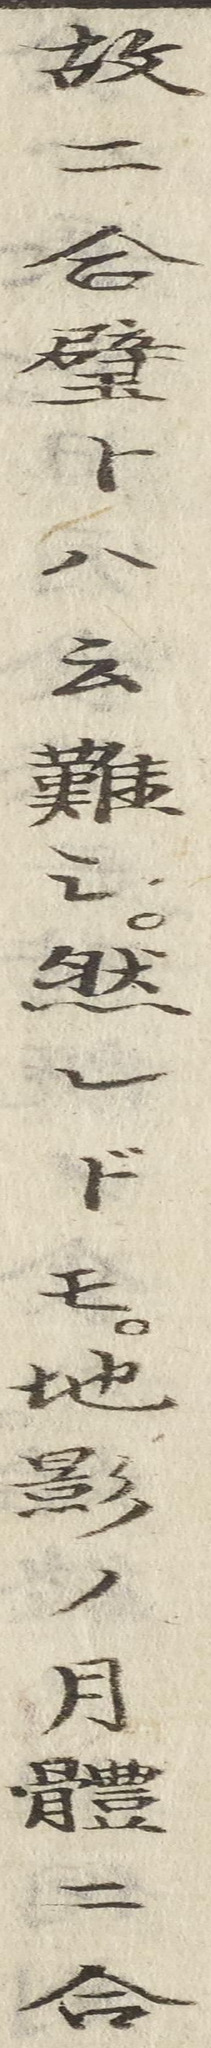故ニ合璧トハ云難シ。然レドモ。地影ノ月体ニ合
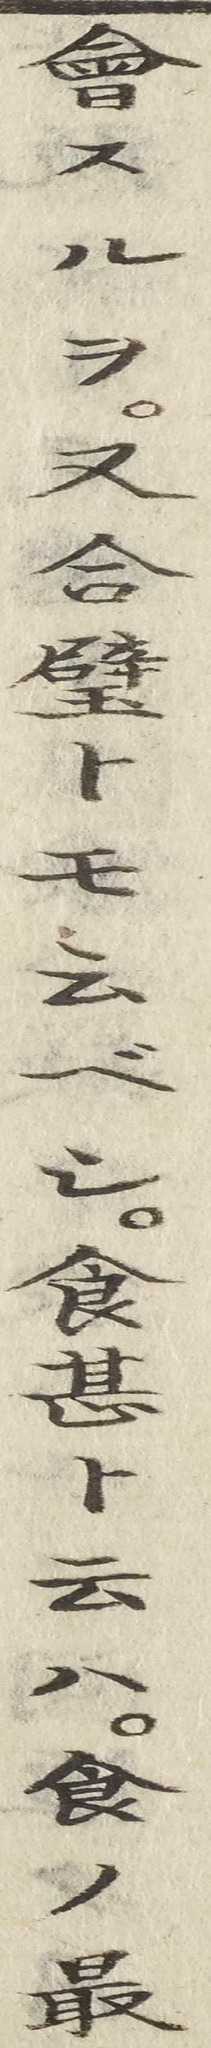会スルヲ。又合璧トモ云ベシ。食甚ト云ハ。食ノ最
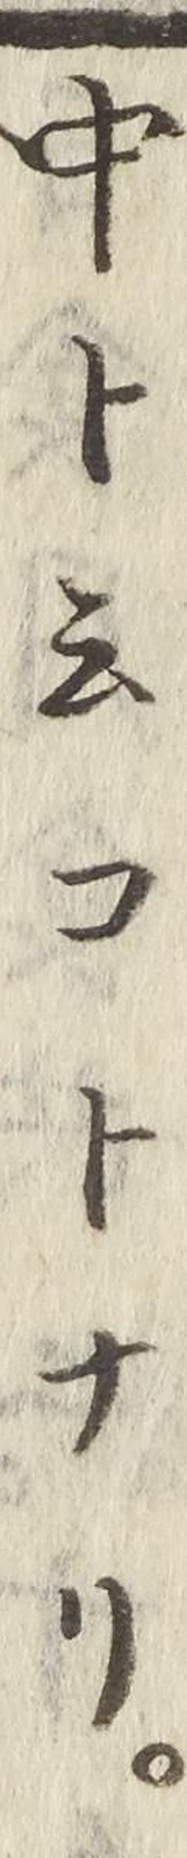中ト云コトナリ。
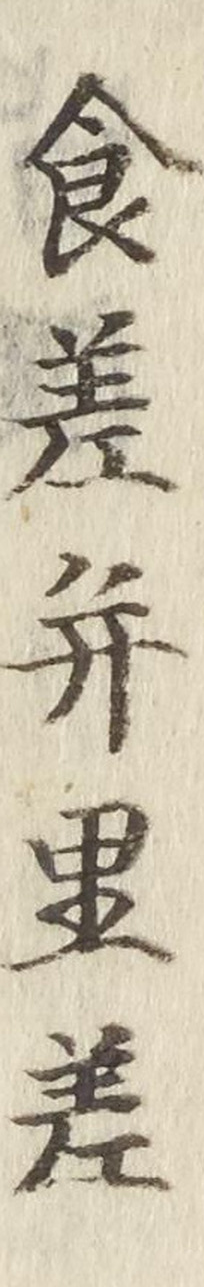食差幷里差
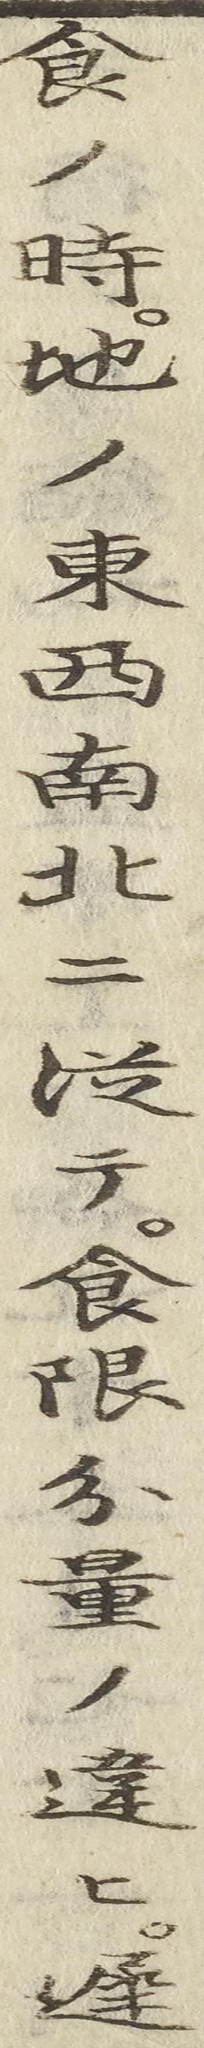食ノ時。地ノ東西南北ニ従テ。食限分量ノ違ヒ。遅
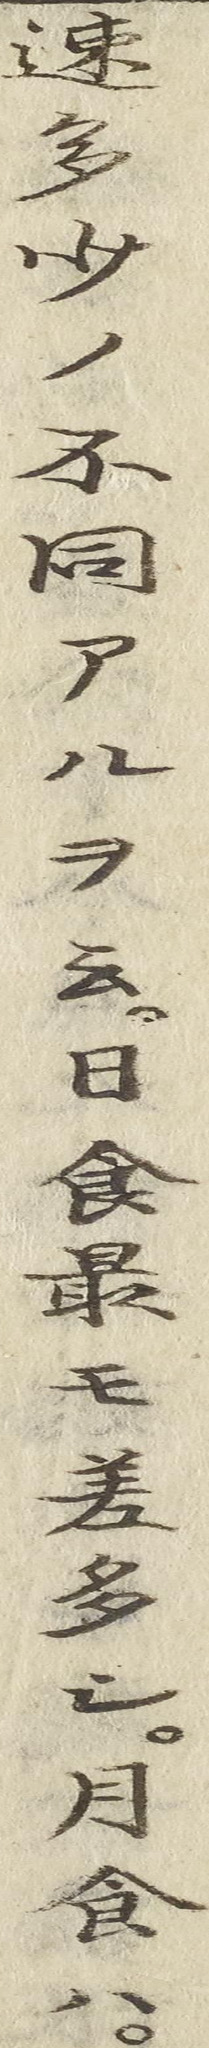速多少ノ不同アルヲ云。日食最モ差多シ。月食ハ。
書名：大略天学名目鈔　天經或問附録
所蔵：東京大学地震研究所図書室 Earthquake Research Institute Library, The University of Tokyo, JAPAN
